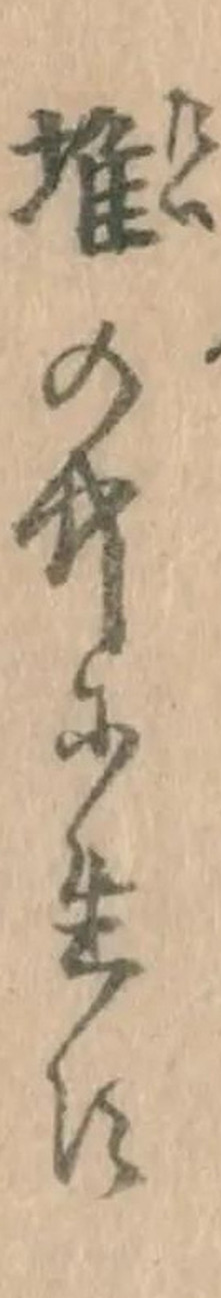堆の中に生す
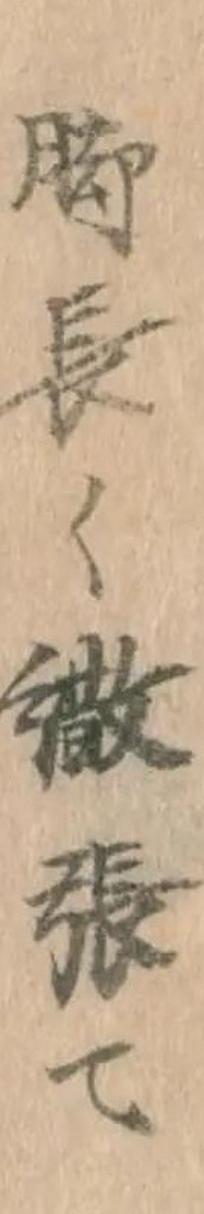脚長く繖張て
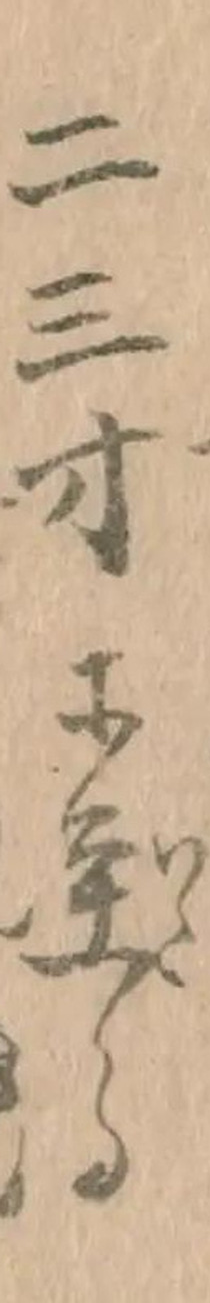二三寸に至る
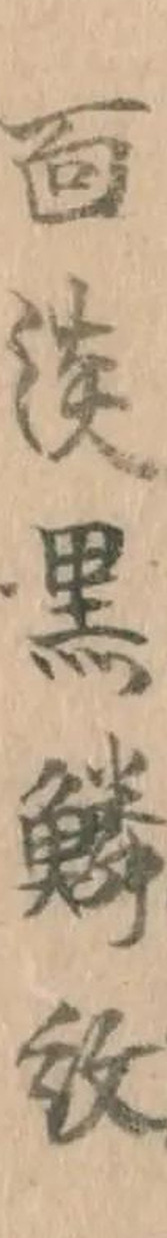面淡黒鱗紋
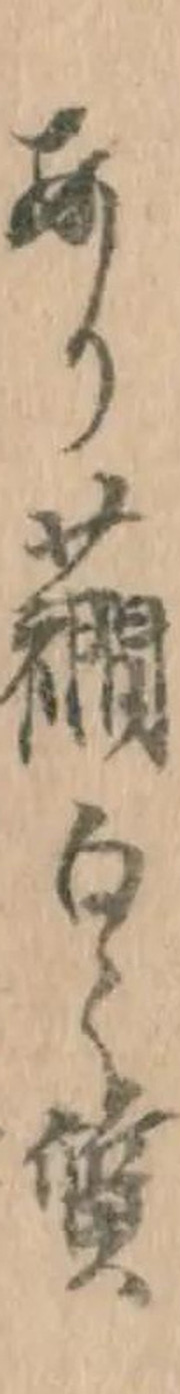あり白く質
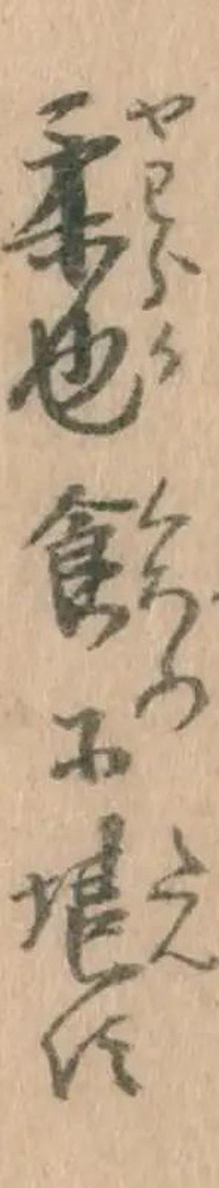柔也食に堪す
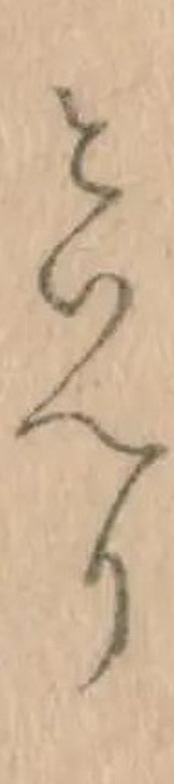といへり

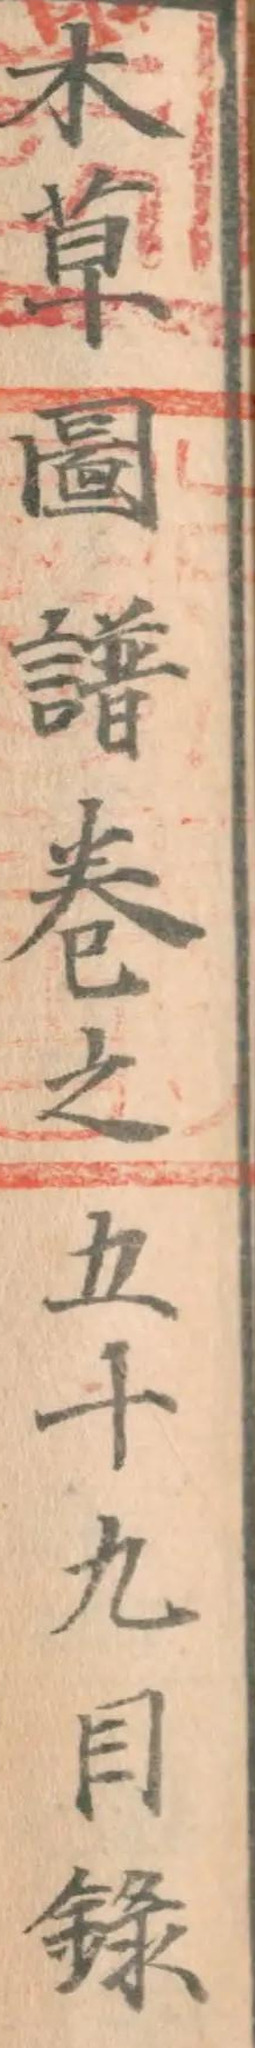木草図譜巻之五十九目録

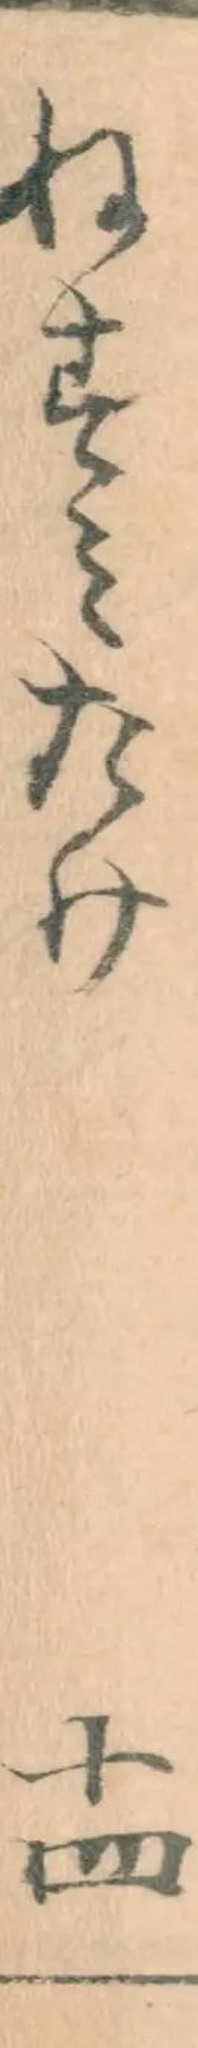ねすみたけ十四同
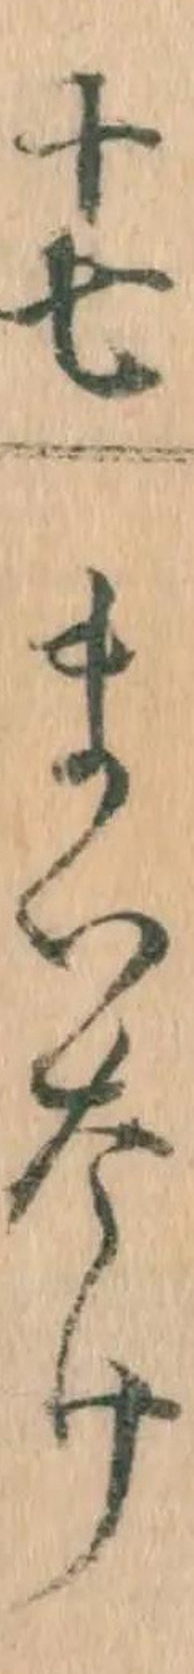同十七まいたけ
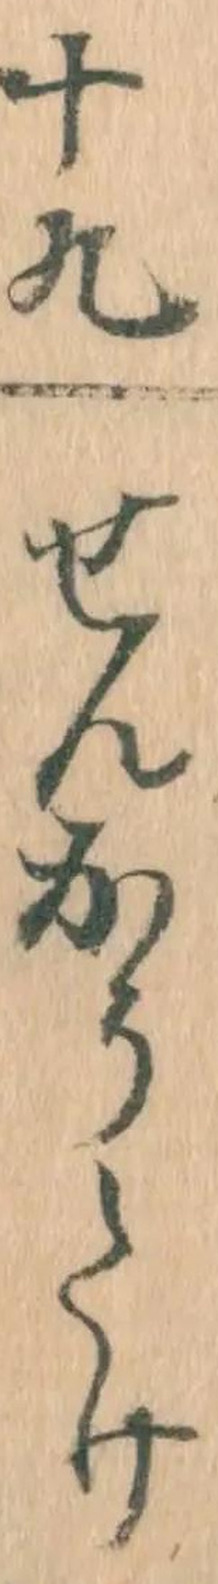同十九せんかうたけ

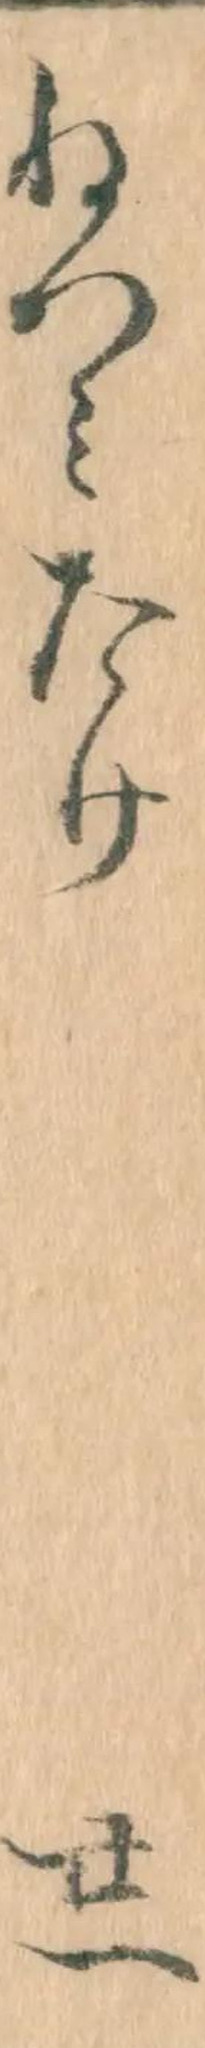ねつみたけ廿一同
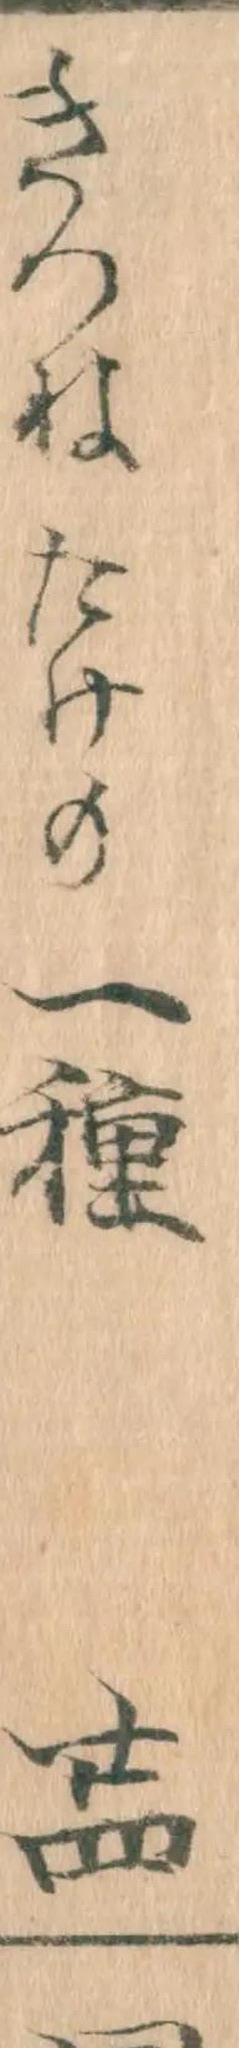きつねたけの一種廿四同
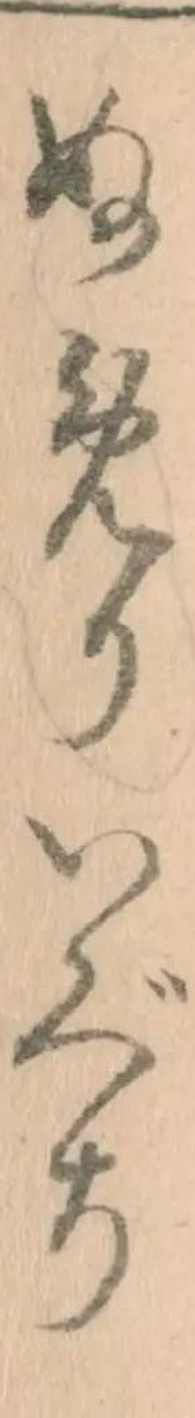ぬめりいぐち
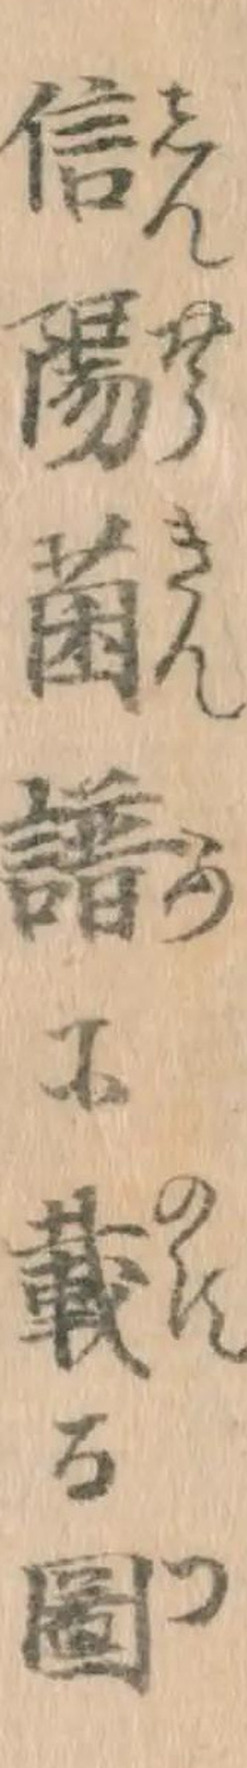信陽菌譜に載る図
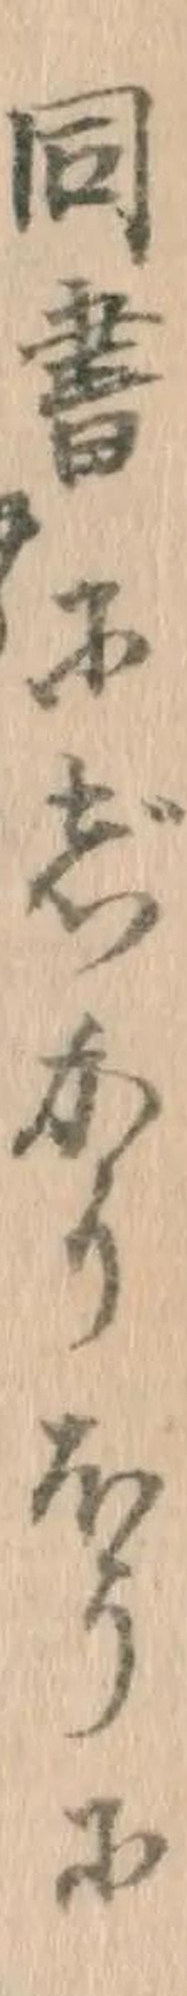同書にじかりほうに
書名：本草図譜. 巻58-60
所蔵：国立国会図書館 National Diet Library, JAPAN
